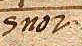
s̄nor
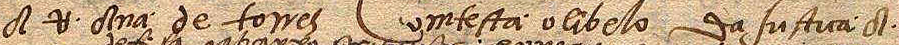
A R. Ana de torres Comtesta o libelo da Justica A.
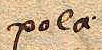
pola.
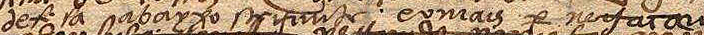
defesa abayxo sseguinte . e o mais ꝑ negacam /
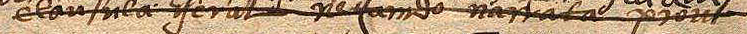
clausula geraL negando narrata prou/
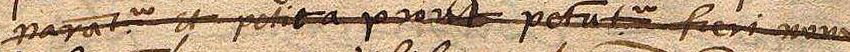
nar̄at Et petit a prout pertūt̄ fieri nom
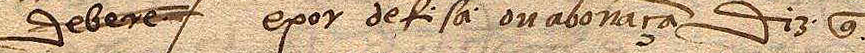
debere./ e por defesa. ou abonāça diz. q̄.
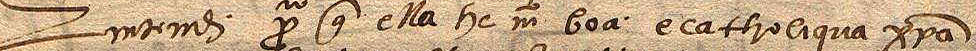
Emtemdi ꝓ̄ q̄ ella he mto boa e catholiqua xp̄a
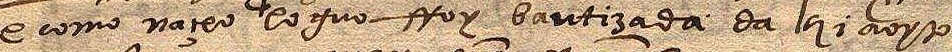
e como naçeo loguo ffoy bautizada. da hi a oyto
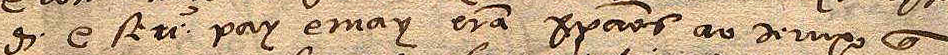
di e seu. pay e may er̄a xpãos ao tempo q̄
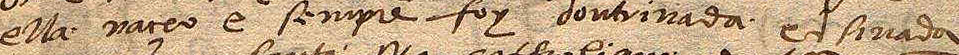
ella naçeo e sempre foy doutrinada. e ēsinada
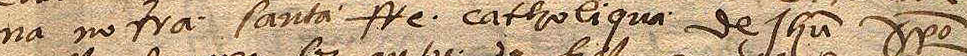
na nossa. santa. ffe. catholiqua. de Jhū Xp̄o
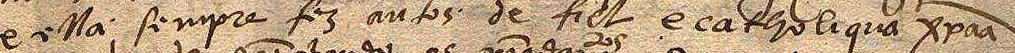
e ella. sempre fez autos. de fiel e catholiqua xpāa
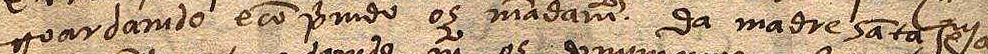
goardamdo e c̄opimdo os m̄adamtos. da madre sāta Jḡja
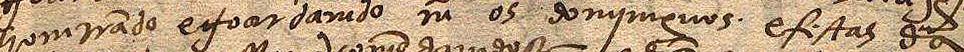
homrrādo e goardamdo mto os domjmguos. e festas da
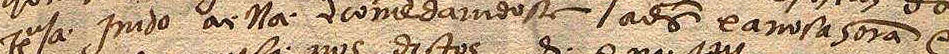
Jḡja. Jmdo a ella. ēcom̄edamdosse a ds̄ e a nosa sōra e
